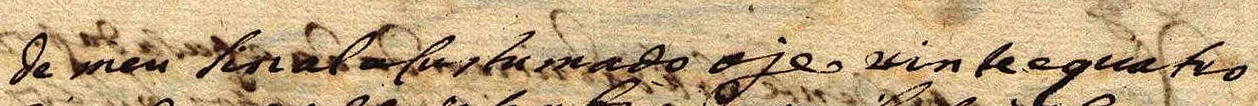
de meu sinal aCustumado oje uinte e quatro
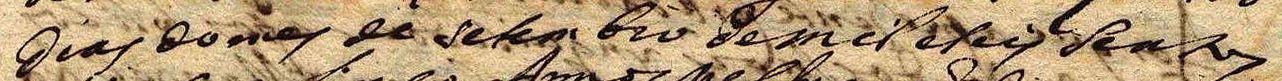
dias do mes de setembro de mil e seissentos
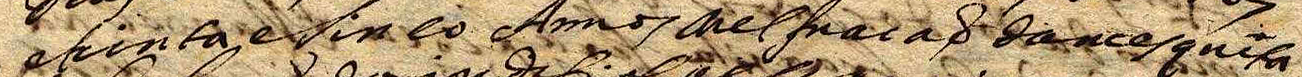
e trinta e sinco Annos Mel fraiaõ da mesquita
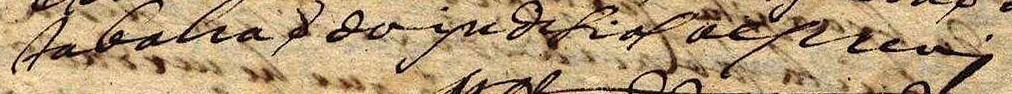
tabaliaõ do yudisial o escreuj
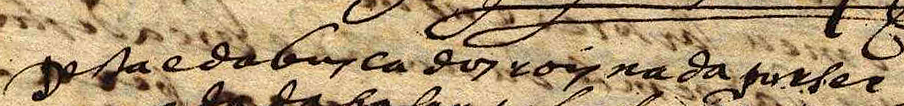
Desta e da busca dos rois nada por ser
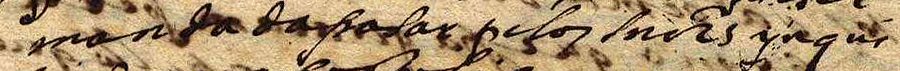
mandada pasar pelos snor̄s ynqui
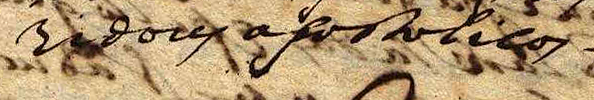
zidores apostolicos
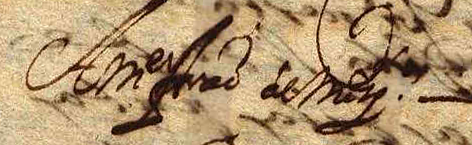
A mel fraiaõ de mesqta.
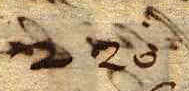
220
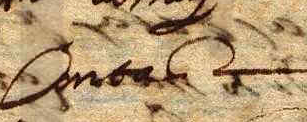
Conta
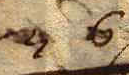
36
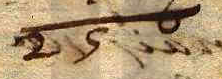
256
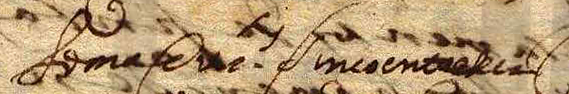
Soma duztos sincoenta e seis
